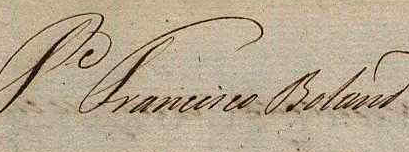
P.e Francisco Boland
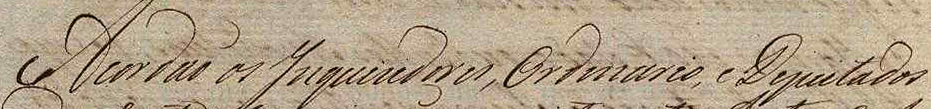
Acordaõ os Jnquisidores, Ordinario, e Deputados
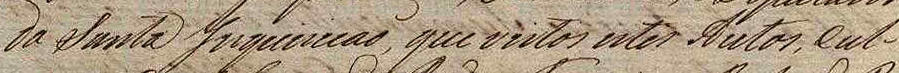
da Santa Jnquisicao, que vistos estes Autos, cul
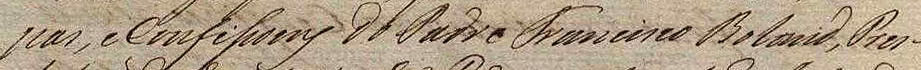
pas, e Confissoens do Padre Francisco Boland, Pres
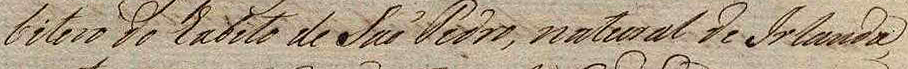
bitero do habito de Saõ Pedro, natural de Irlanda,
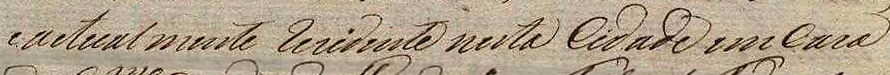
e actualmente Rezidente nesta Cidade em caza
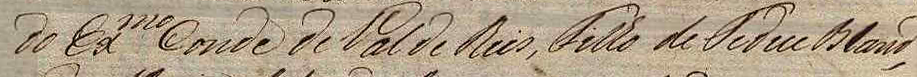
do Ex.mo Conde de Val de Reis, Filho de Tedeu Bland
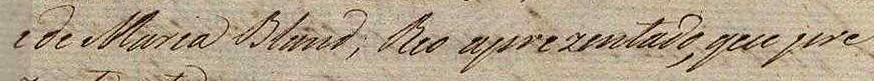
e de Maria Blund; Reo aprezentado, que pre
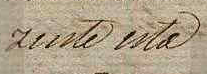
zente esta
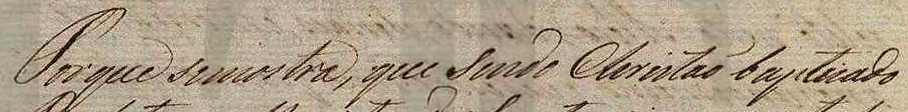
Porque se mostra, que sendo Christaõ baptizado
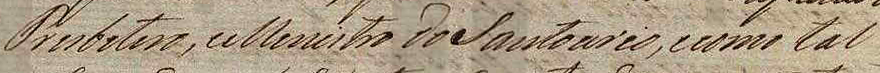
Presbetero, e Menistro do Santoario, e como tal
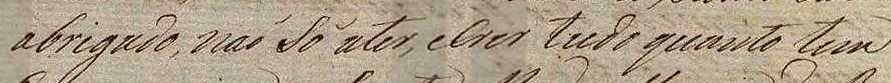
obrigado, naõ só a ter, e crer tudo quanto tem
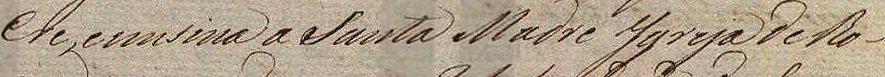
cre, e emsina a Santa Madre Jgreja de Ro
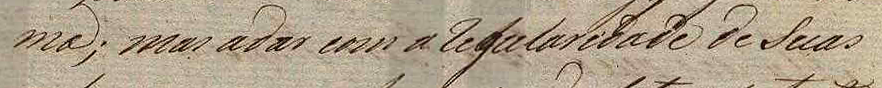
ma; mas a dar com a Regularidade de suas
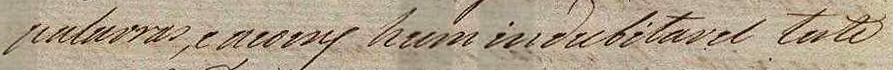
palavras, e acoens hum indubitavel teste
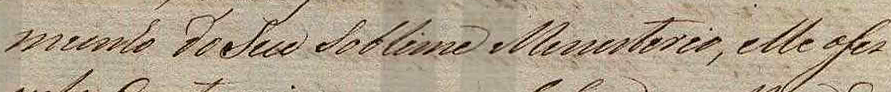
munho do seu Soblime Menisterio, elle o fez
